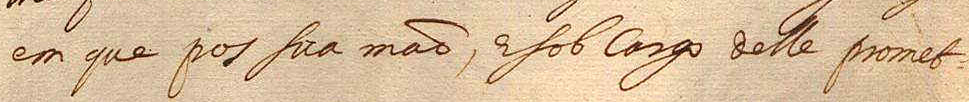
em que pos sua mão, E sob cargo delle promet
